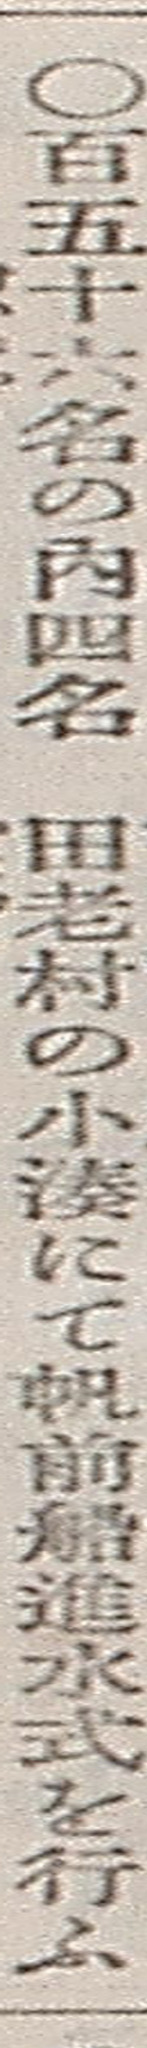○百五十六名の内四名田老村の小湊にて帆前船進水式を行ふ
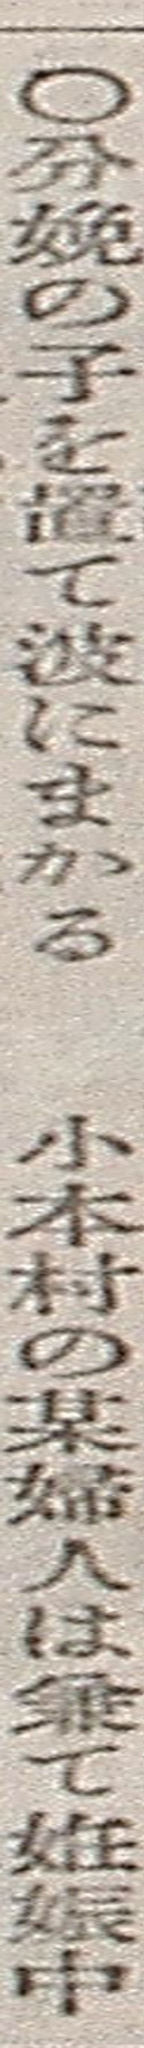○分娩の子を置て波にまかる小本村の某婦人は兼て妊娠中
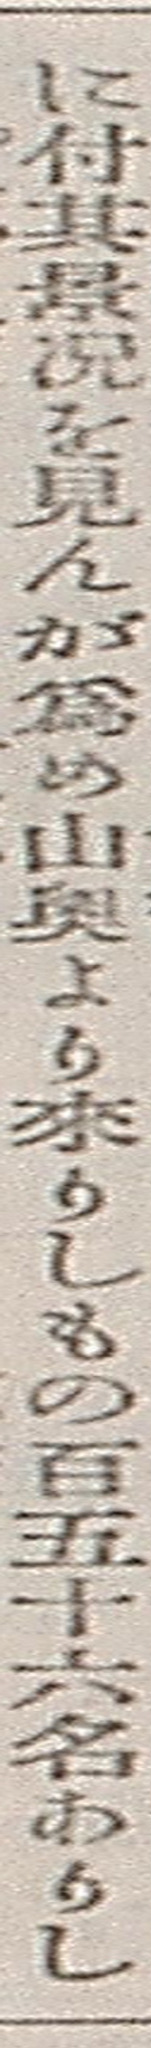に付其景况を見んが為め山奥より来りしもの百五十六名ありし
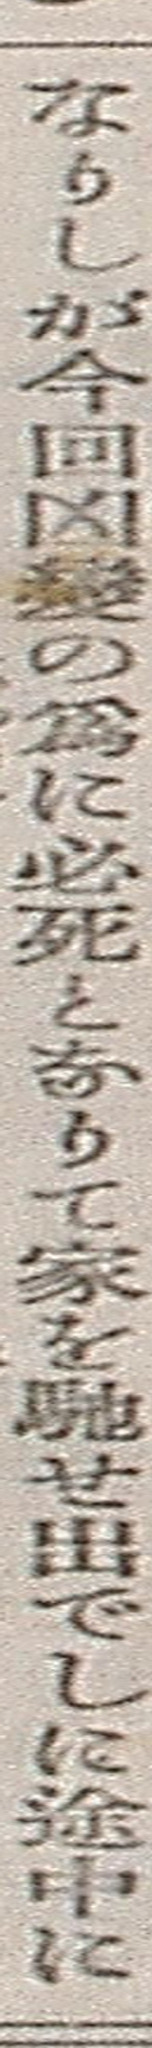なりしが今回凶変の為に必死となりて家を馳せ出でしに途中に
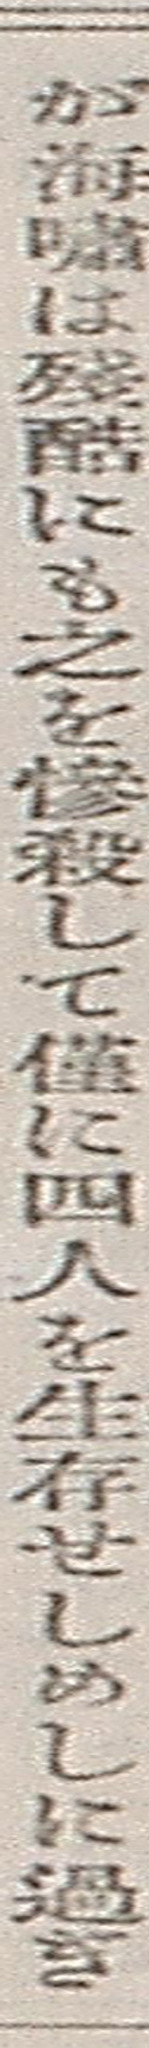が海嘯は残酷にも之を惨殺して僅に四人を生存せしめしに過ぎ
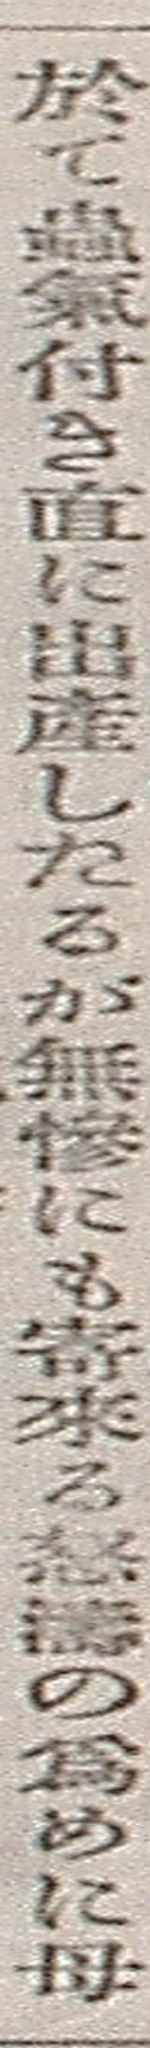於て蟲気付き直に出産したるが無惨にも寄来る怒濤の為めに母
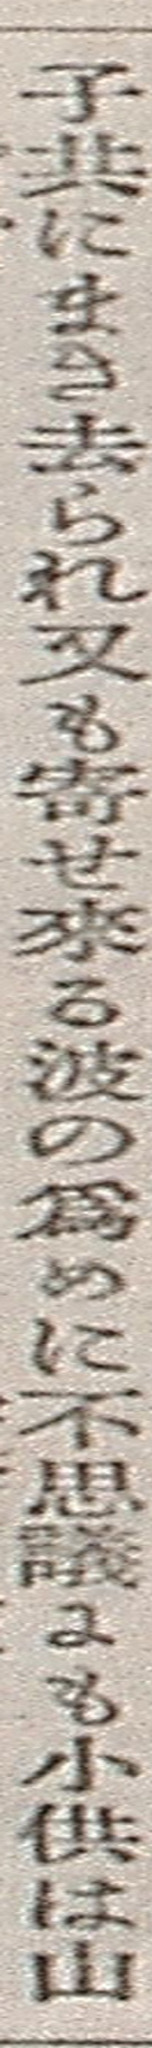子共にまき去られ又も寄せ来る波の為めに不思議にも小供は山
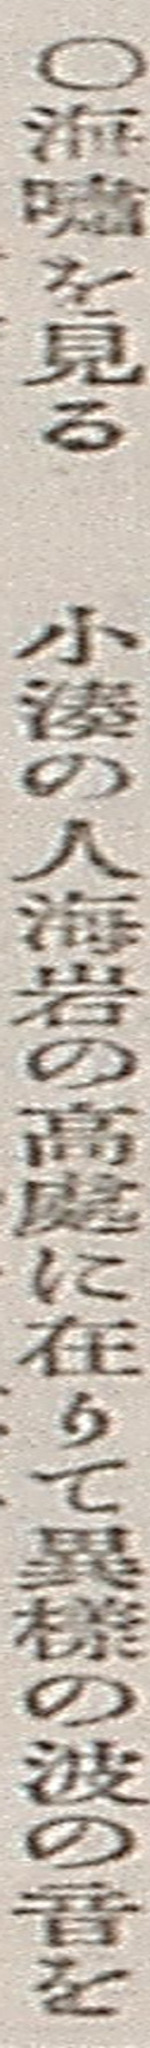○海嘯を見る小湊の人海岩の高処に在りて異様の波の音を
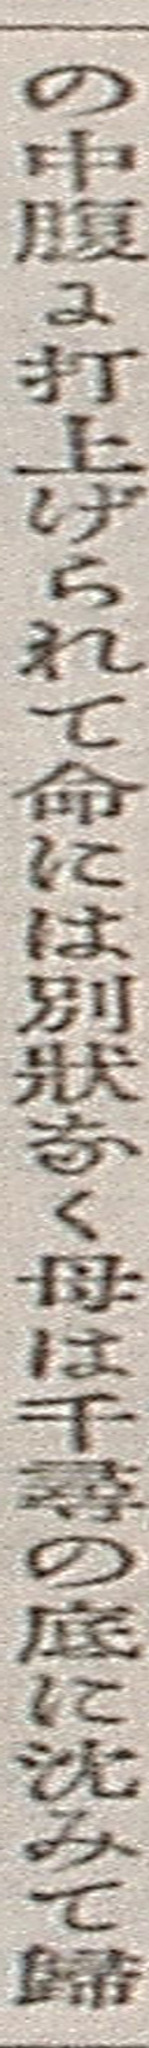の中腹に打上げられて命には別条なく母は千尋の底に沈みて帰
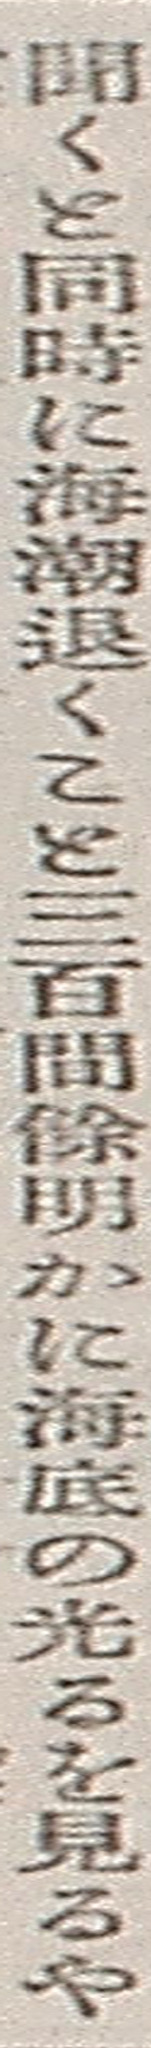聞くと同時に海潮退くこと三百間余明かに海底の光るを見るや
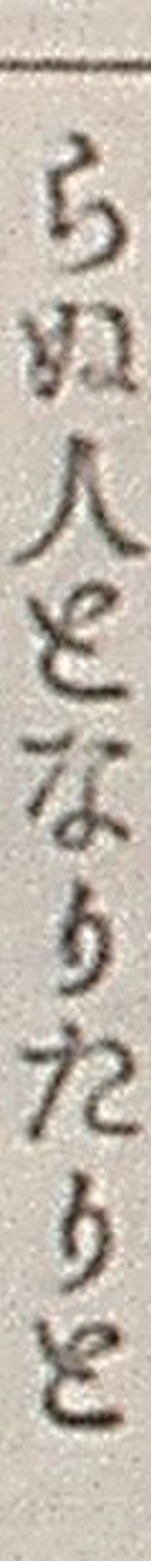らぬ人となりたりと
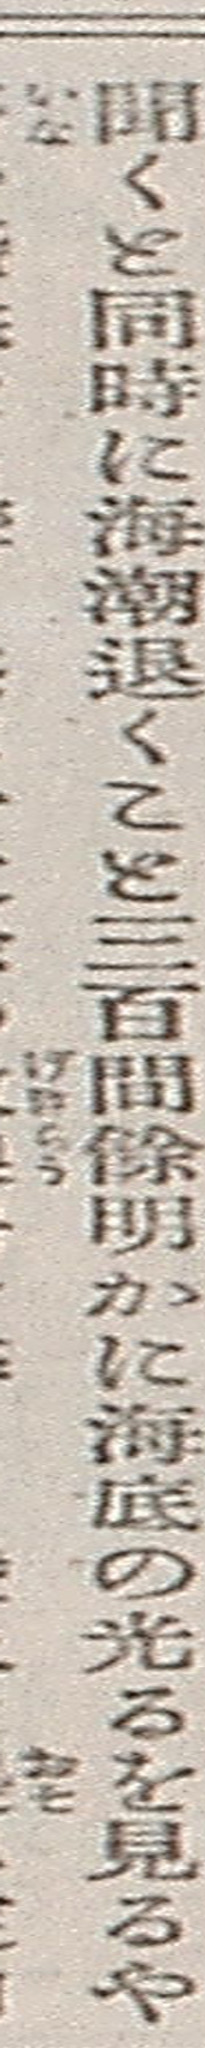聞くと同時に海潮退くこと三百間余明かに海底の光るを見るや
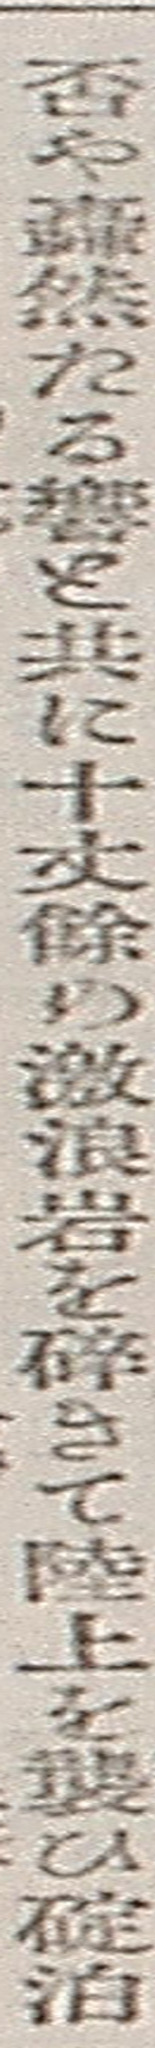否や轟然たる響と共に十丈余の激浪岩を砕きて陸上を襲ひ碇泊
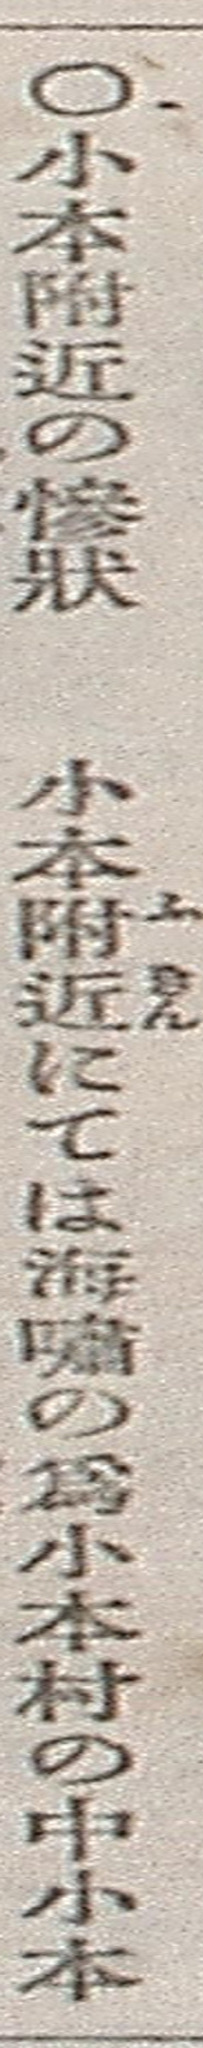○小本付近の惨状小本付近にては海嘯の為小本村の中小本
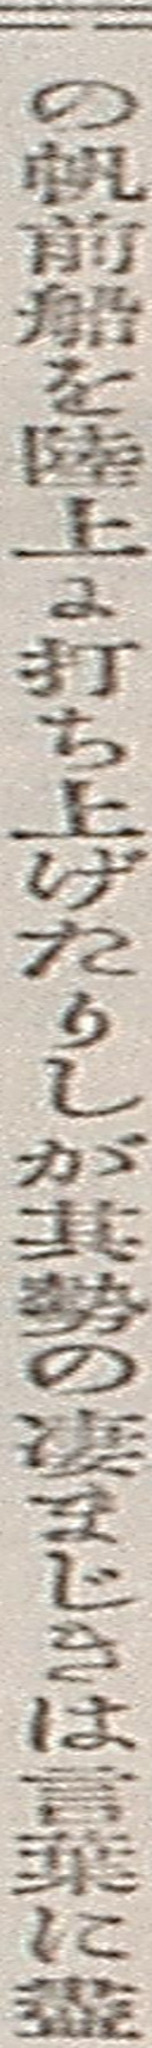の帆前船を陸上に打ち上げたりしが其勢の凄まじきは言葉に尽
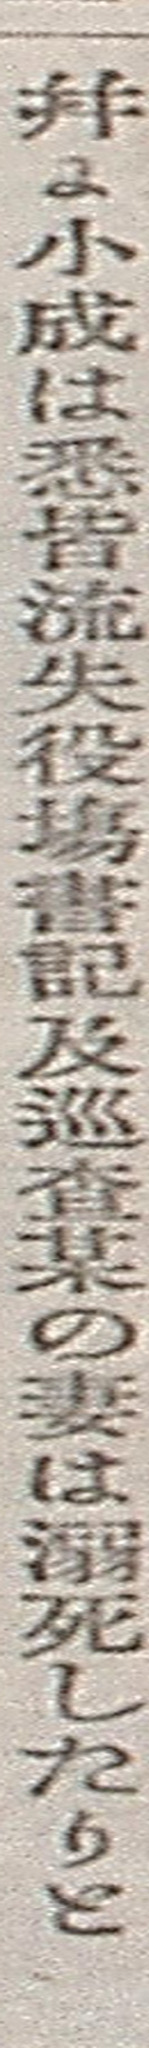井に小成は悉皆流失役場書紀及巡査某の妻は溺死したりと
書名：風俗畫報臨時増刊第百十九號　大海嘯被害録（中）
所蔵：東京大学地震研究所図書室 Earthquake Research Institute Library, The University of Tokyo, JAPAN
